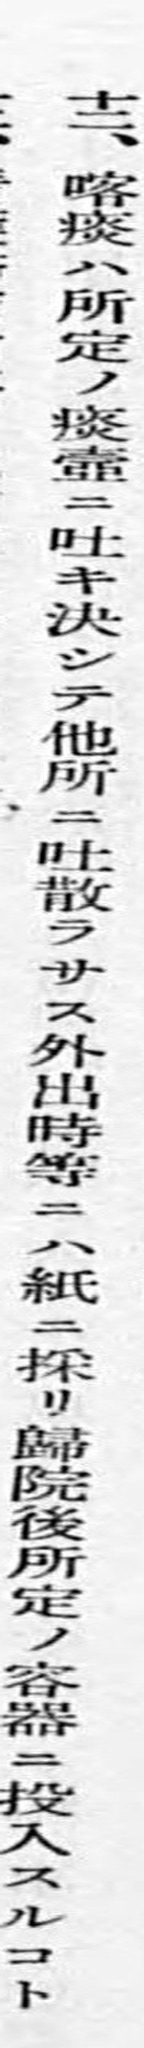十二、喀痰ハ所定ノ痰壺ニ吐キ決シテ他所ニ吐散ラサス外出時等ニハ紙ニ採リ帰院後所定ノ容器ニ投入スルコト
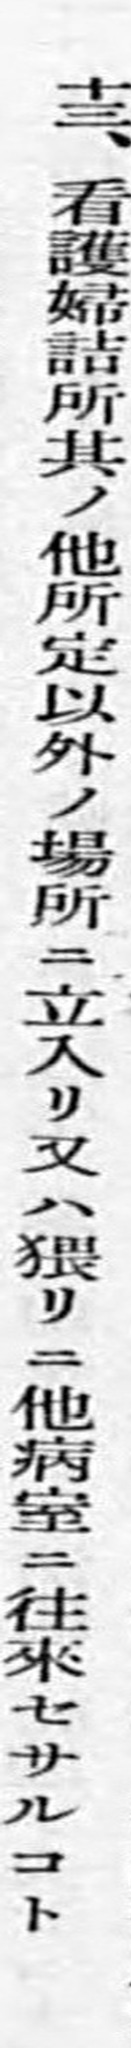十三、看護婦詰所其ノ他所定以外ノ場所ニ立入リ又ハ猥リニ他病室ニ往来セサルコト
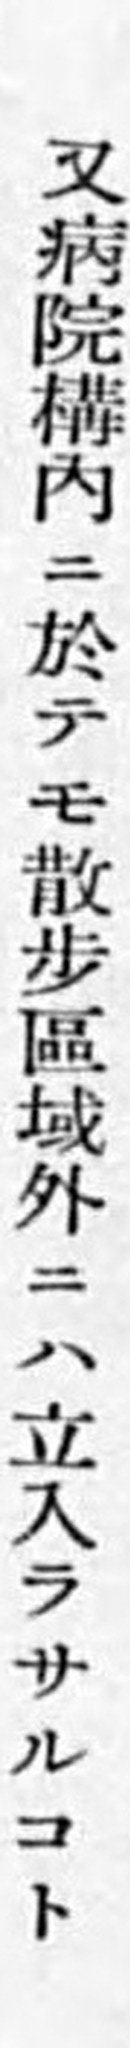又病院構内に於テモ散歩区域外ニハ立入ラサルコト
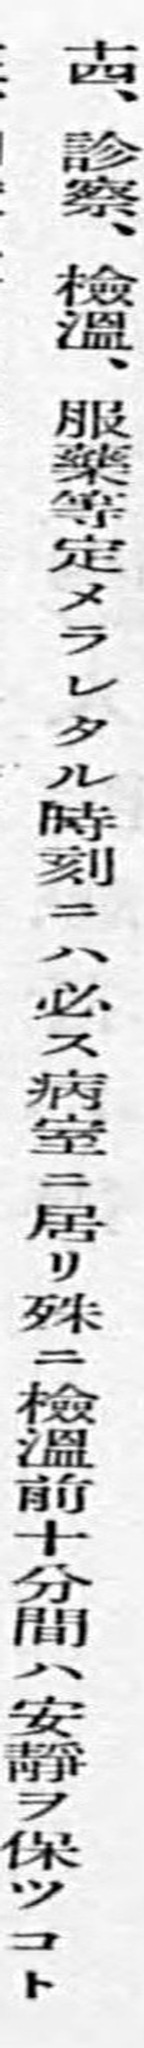十四、診察、検温、服薬等定メラレタル時刻ニハ必ス病室ニ居リ殊ニ検温前十分間ハ安静ヲ保ツコト
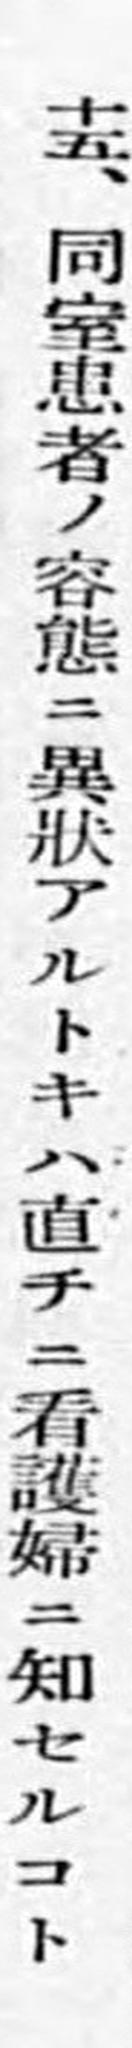十五、同室患者ノ容態ニ異状アルトキハ直チニ看護婦ニ知セルコト
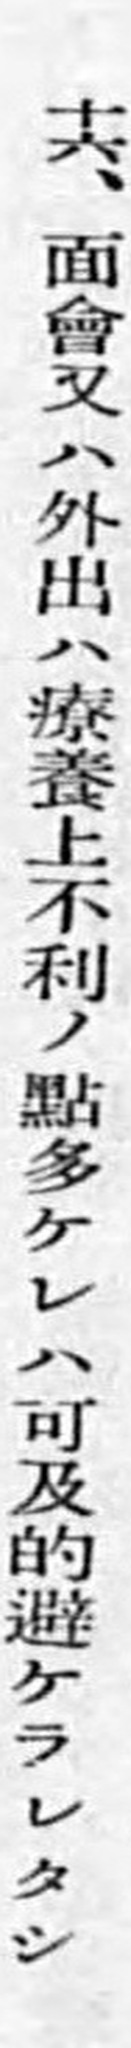十六、面会又ハ外出ハ療養上不利ノ点多ケレハ可及的避ケラレタシ
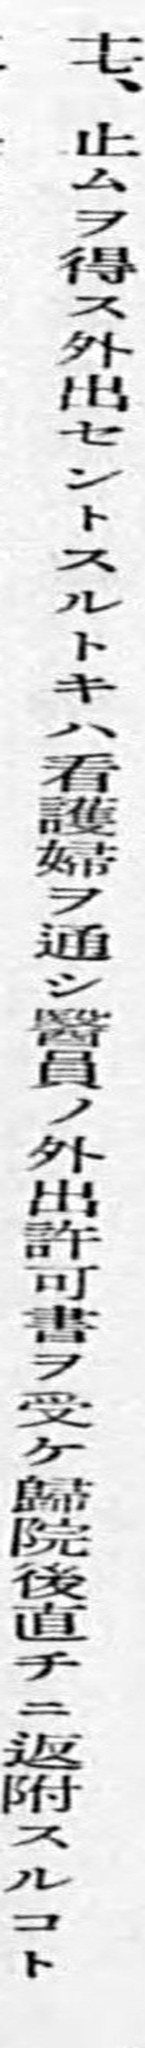十七、止ムヲ得ス外出セントスルトキハ看護婦ヲ通シ医員ノ外出許可書ヲ受ケ帰院後直チニ返附スルコト
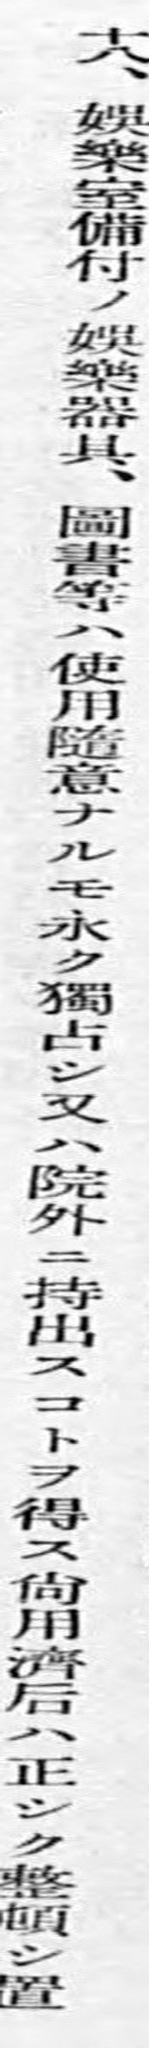十八、娯楽室備付ノ娯楽器具、図書等ハ使用随意ナルモ永ク独占シ又ハ院外ニ持出スコトヲ得ス尚用済后ハ正シク整頓シ置
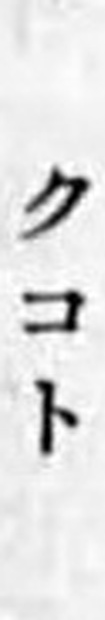クコト
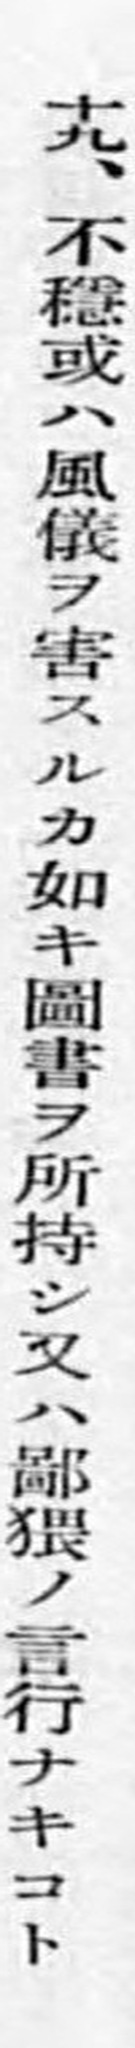十九、不穏或ハ風儀ヲ害スルカ如キ図書ヲ所持シ又ハ鄙猥ノ言行ナキコト
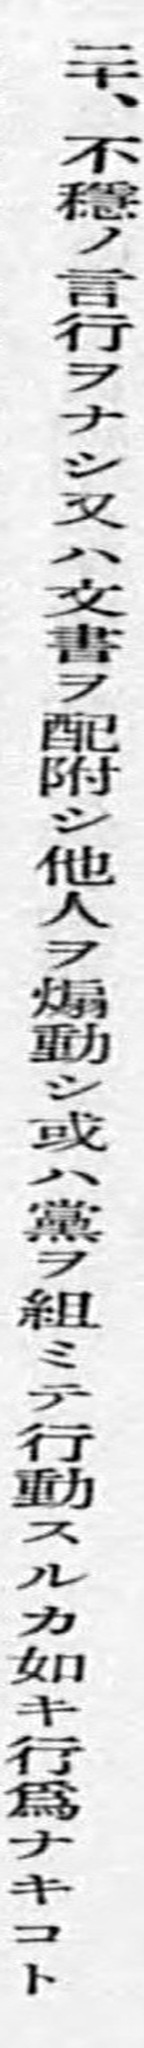二十、不穏ノ言行ヲナシ又ハ文書ヲ配附シ他人ヲ煽動シ或ハ党ヲ組ミテ行動スルカ如キ行為ナキコト
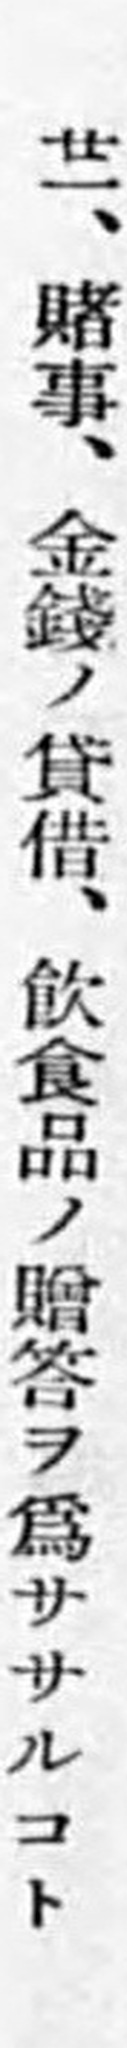廿一、賭事、金銭ノ貸借、飲食品ノ贈答ヲ為ササルコト
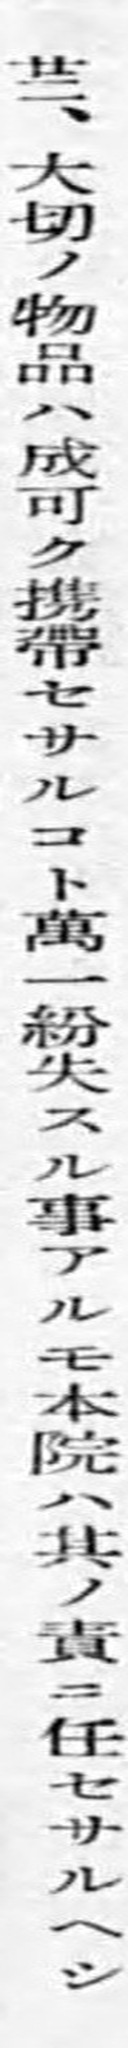廿二、大切ノ物品ハ成可ク携帯セサルコト万一紛失スル事アルモ本院ハ其ノ責ニ任セサルヘシ
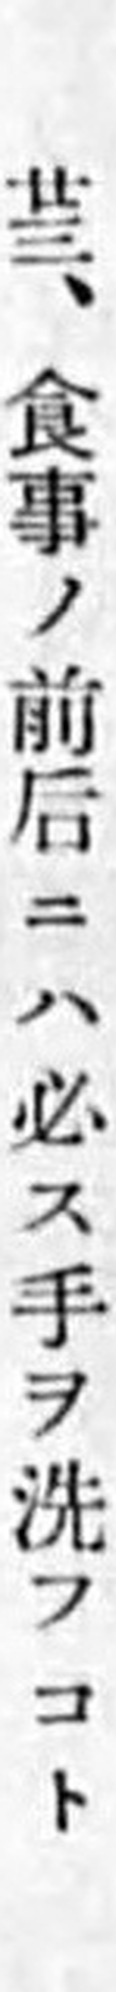廿三、食事ノ前后ニハ必ス手ヲ洗フコト
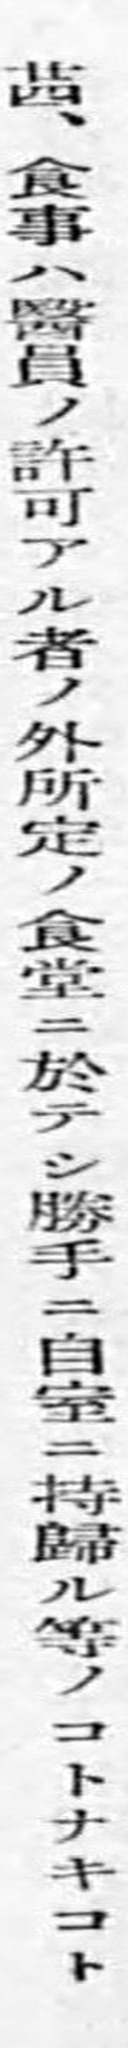廿四、食事ハ医員ノ許可アル者ノ外所定ノ食堂ニ於テシ勝手ニ自室ニ持帰ル等ノコトナキコト
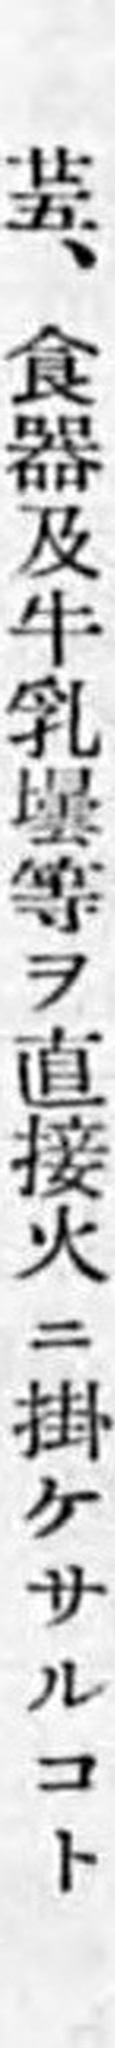廿五、食器及牛乳壜等ヲ直接火ニ掛ケサルコト
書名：豊橋市立高山病院年報. 昭和12年度
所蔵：国立国会図書館 National Diet Library, JAPAN
